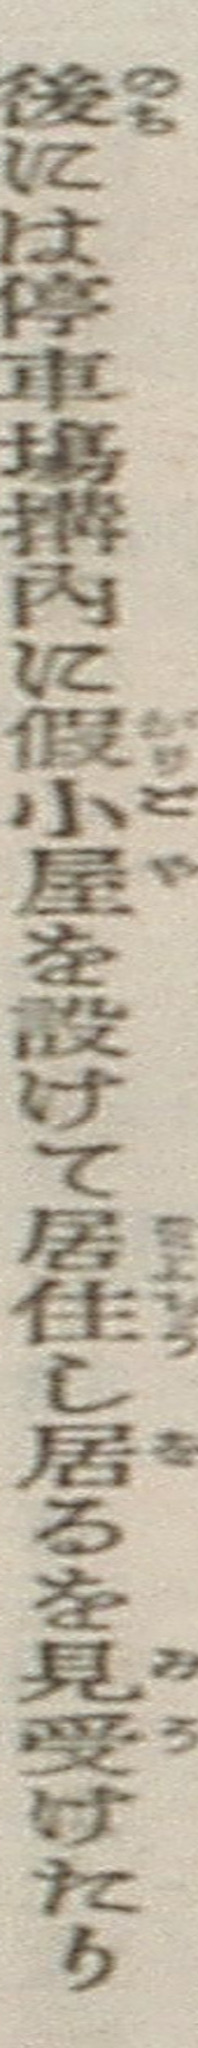後には停車場構内に仮小屋を設けて居住し居るを見受けたり
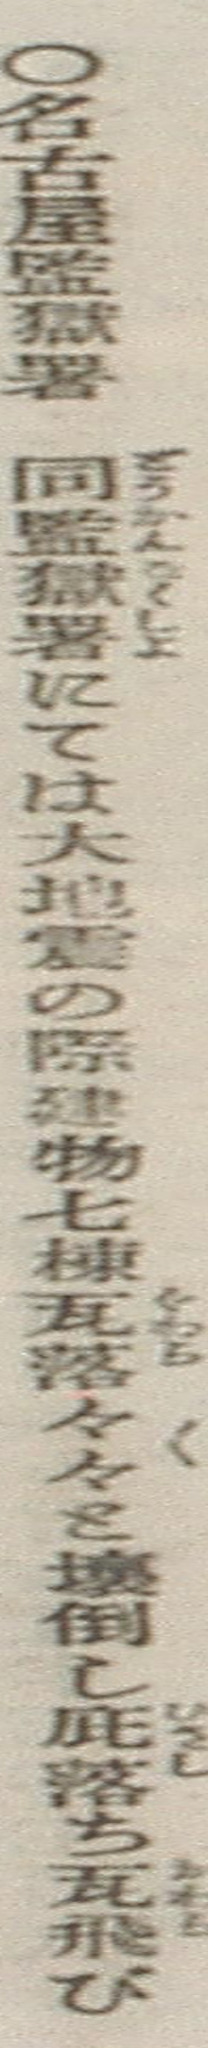○名古屋監獄署同監獄署にては大地震の際建物七棟瓦落々々と壊倒し庇落ち瓦飛び
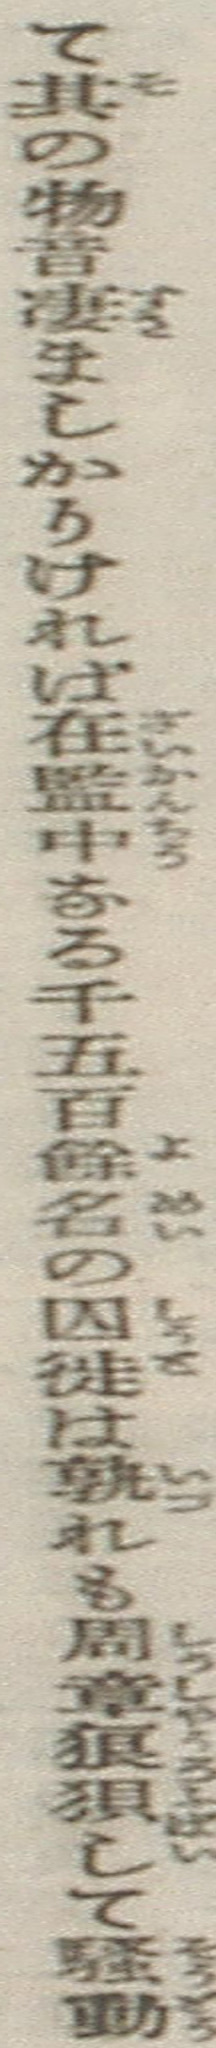て其の物音凄ましかりければ在監中なる千五百余名の囚徒は孰れも周章狼狽して騒動
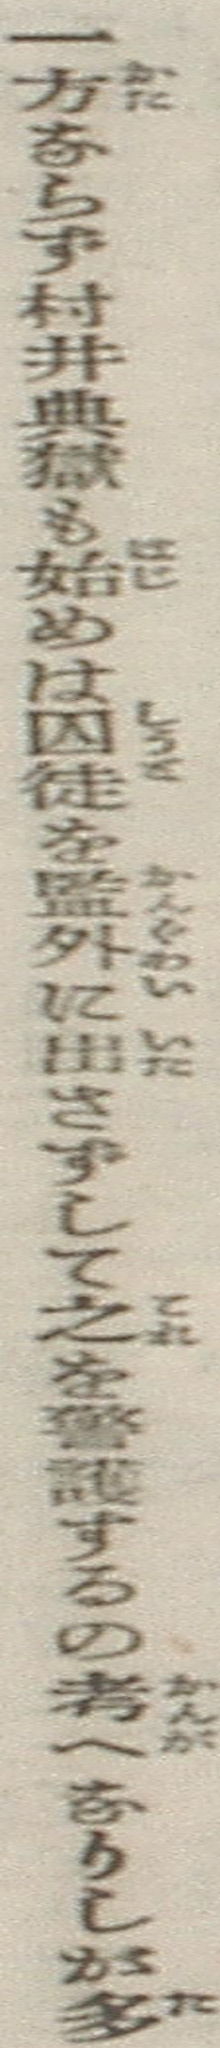一方ならず村井典獄も始めは囚徒を監外に出さずして之を警護するの考へなりしが多
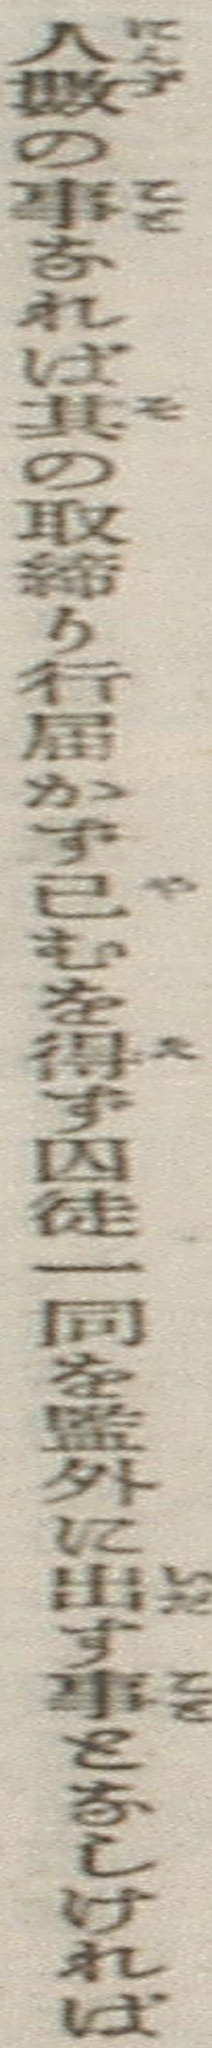人数の事なれば其の取締り行届かず已むを得ず囚徒一同を監外に出す事となしければ
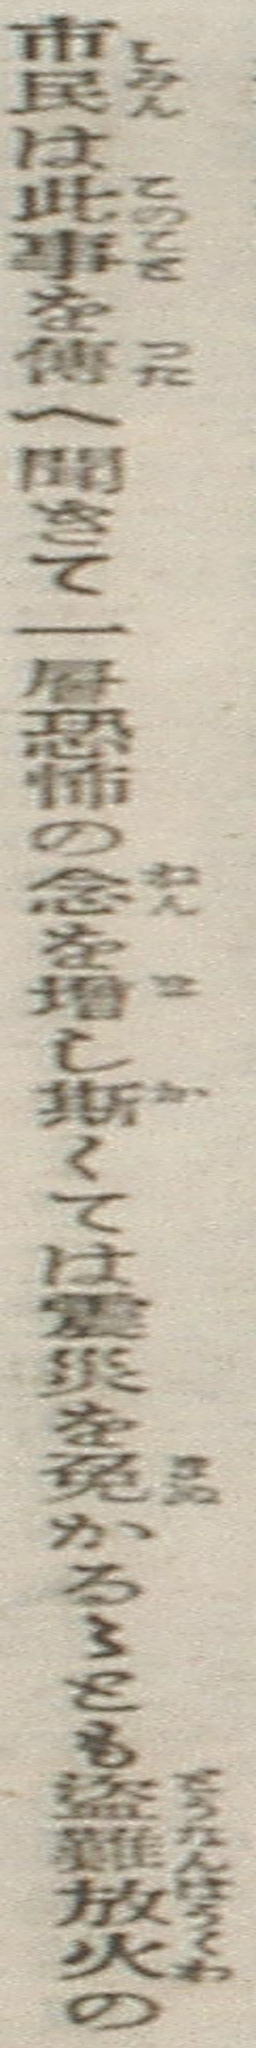市民は此事を伝へ聞きて一層恐怖の念を増し斯くては震災を免かるゝとも盗難放火の
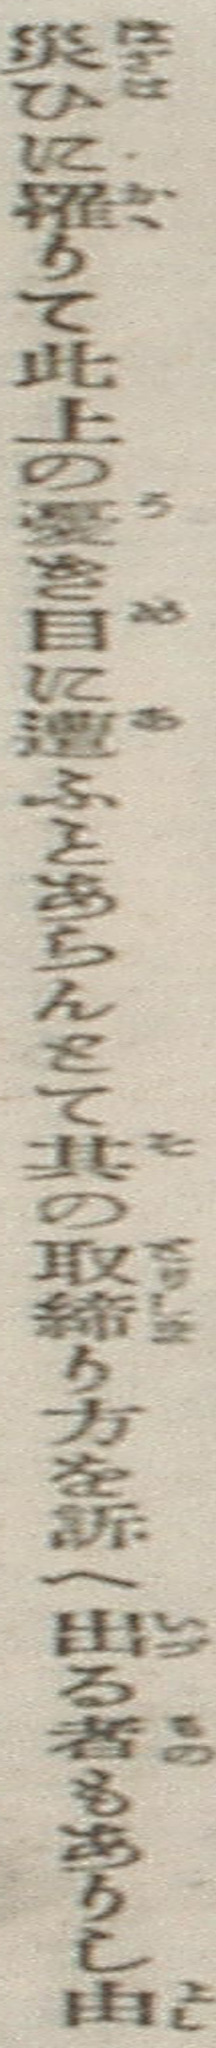災ひに罹りて此上の憂き目に遭ふことあらんとて其の取締り方を訴へ出る者もありし由
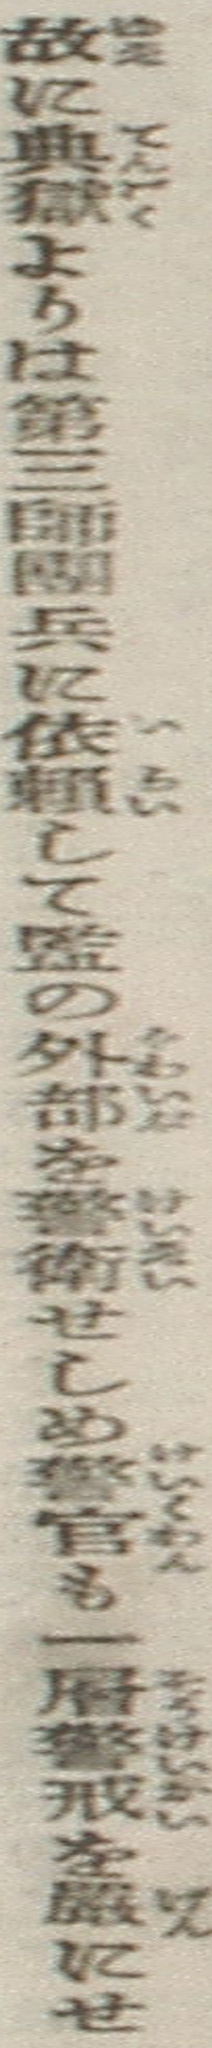故に典獄よりは第三師団兵に依頼して監の外部を警衛せしめ警官も一層警戒を厳にせ

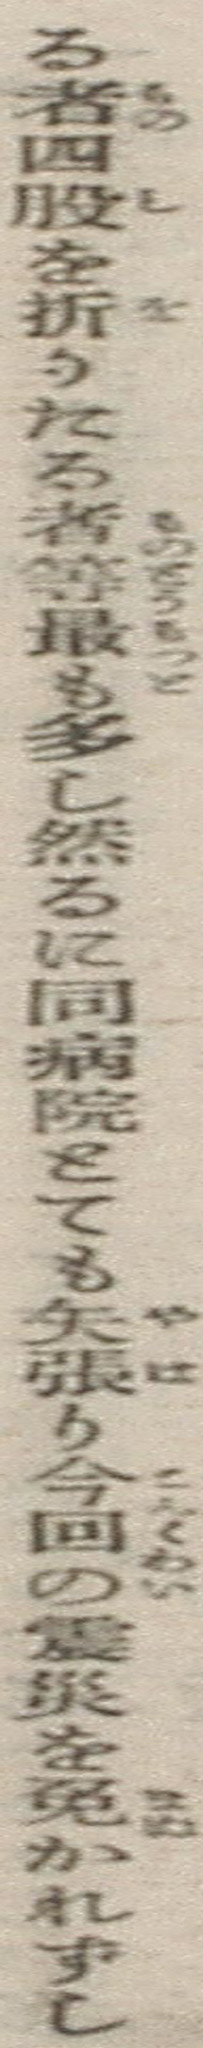る者四股を折りたる者等最も多し然るに同病院とても矢張り今回の震災を免かれずし
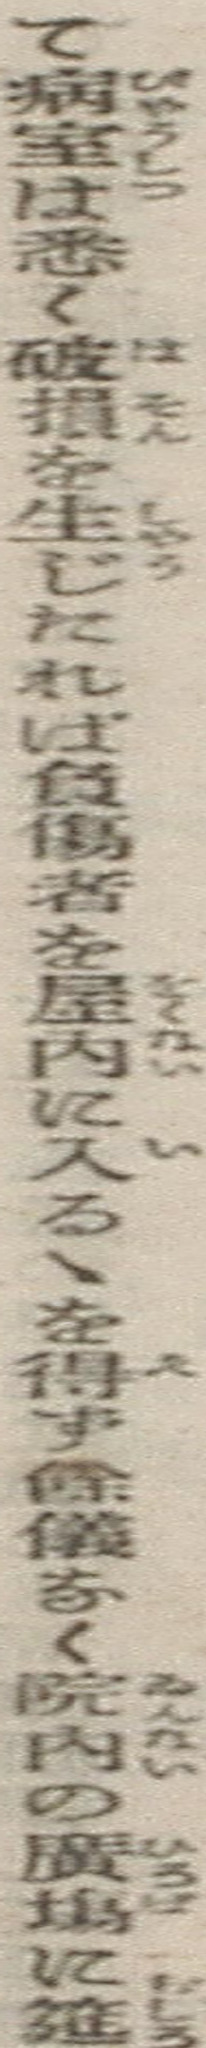て病室は悉く破損を生じたれば負傷者を屋内に入るゝを得ず余儀なく院内の広場に筵
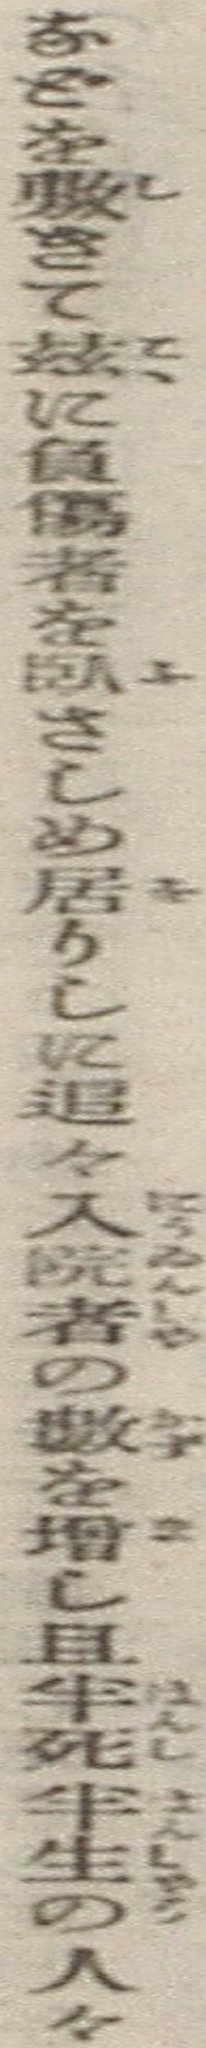などを敷きて茲に負傷者を臥さしめ居りしに追々入院者の数を増し且半死半生の人々
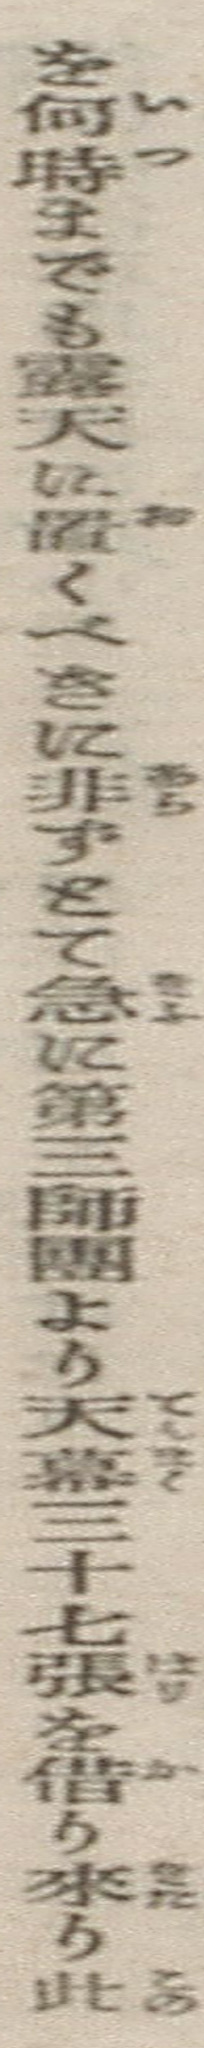を何時までも露天に置くべきに非ずとて急に第三師団より天幕三十七張を借り来り此
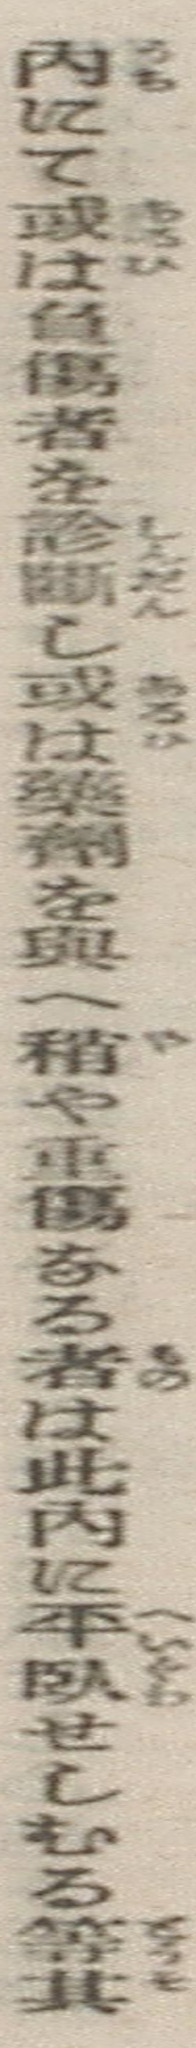内にて或は負傷者を診断し或は薬剤を与へ稍や重傷なる者は此内に平臥せしむる等其
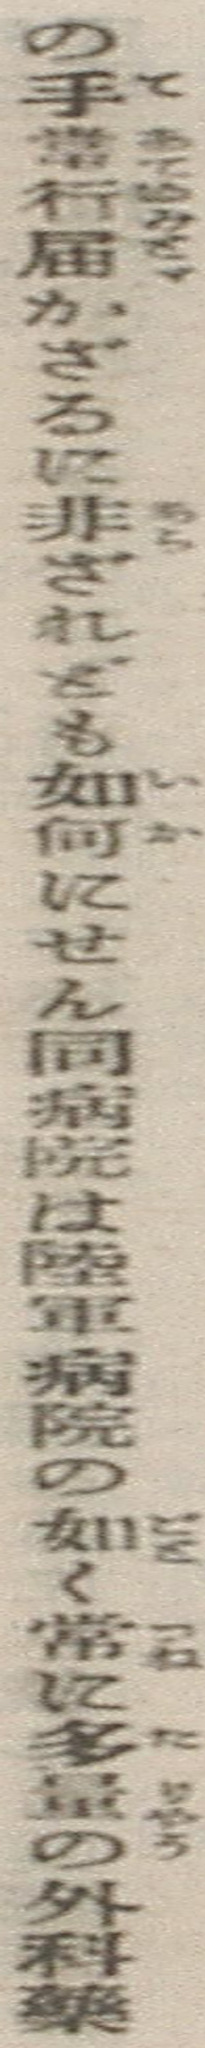の手当行届かざるに非ざれども如何にせん同病院は陸軍病院の如く常に多量の外科薬
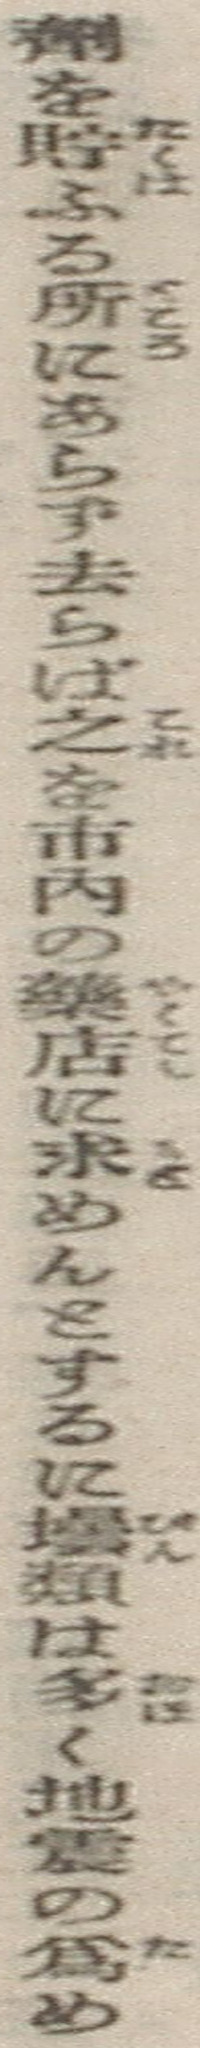剤を貯ふる所にあらず去らば之を市内の薬店に求めんとするに壜類は多く地震の為め
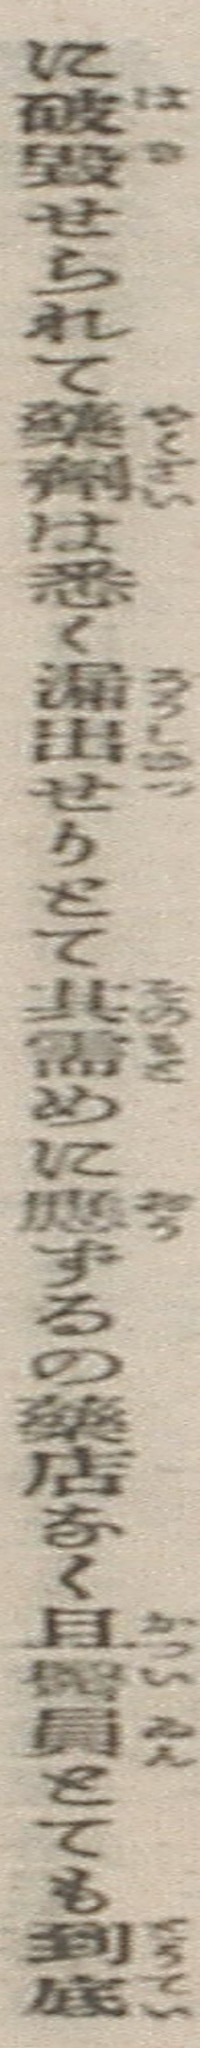に破毀せられて薬剤は悉く漏出せりとて其需めに応ずるの薬店なく且医員とても到底
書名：愛知岐阜福井三県　大地震見聞録（内題）
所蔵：東京大学地震研究所図書室 Earthquake Research Institute Library, The University of Tokyo, JAPAN
